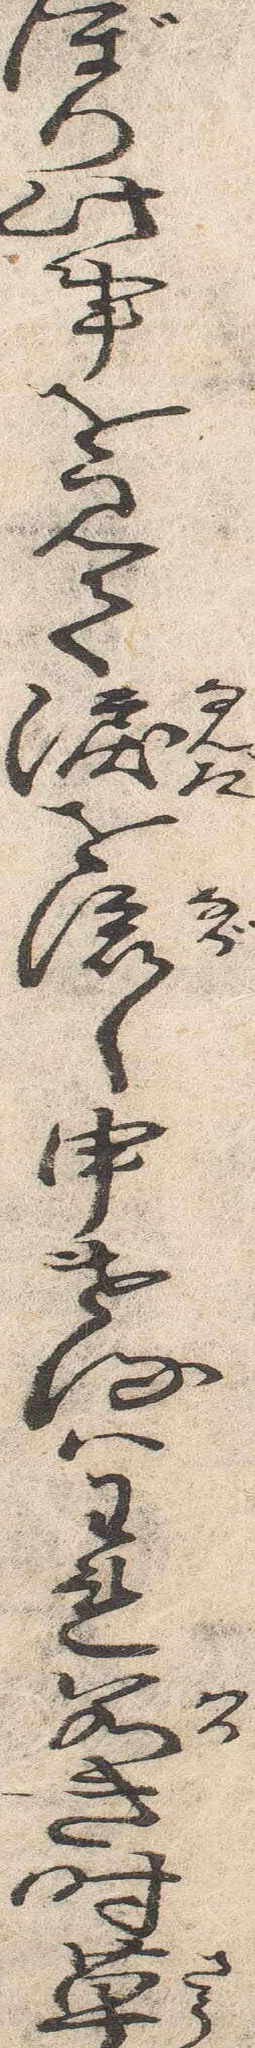ぼり此事を見て涙を流し申けるはわれ若き時草
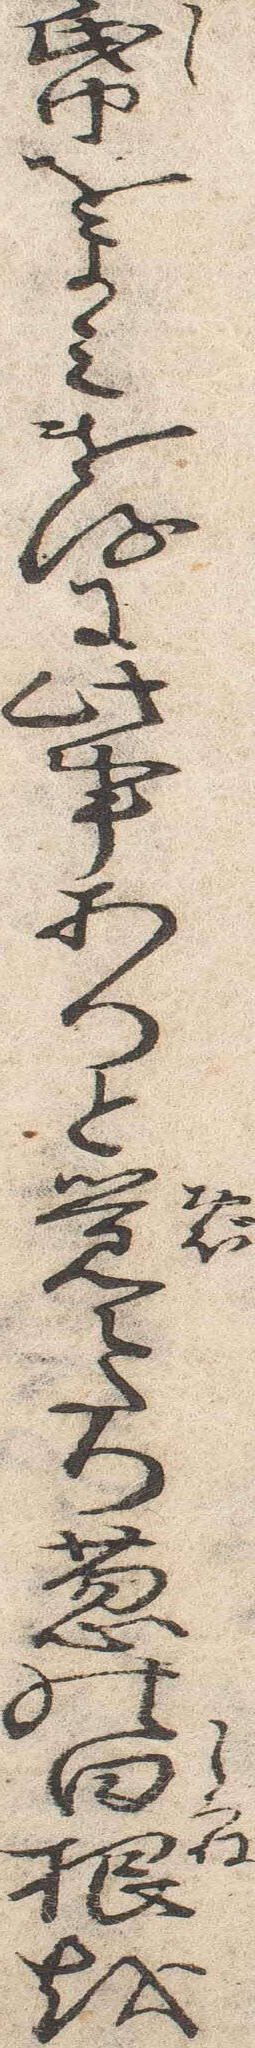紙をよみけるに此事ありと覚えたり葱の白根を
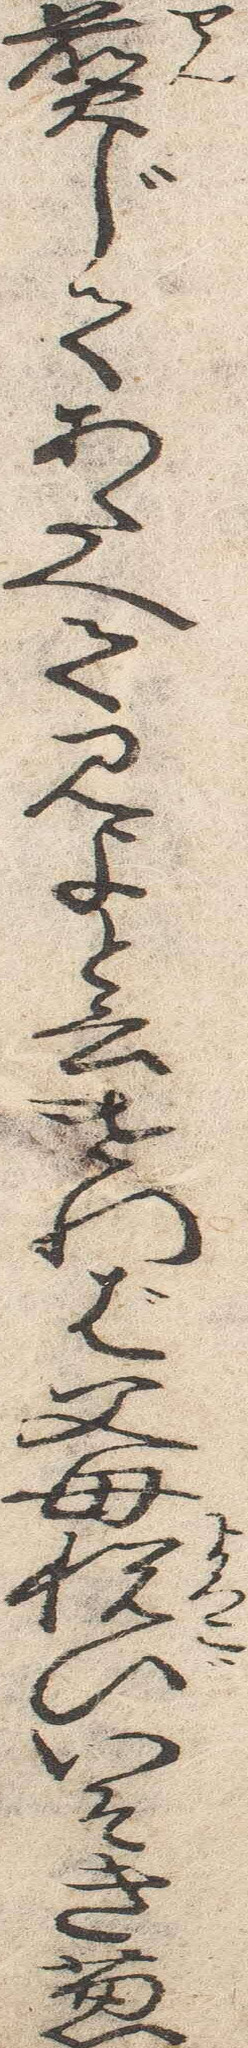煎じてあたへて見よと云ければ父母悦びいそき葱
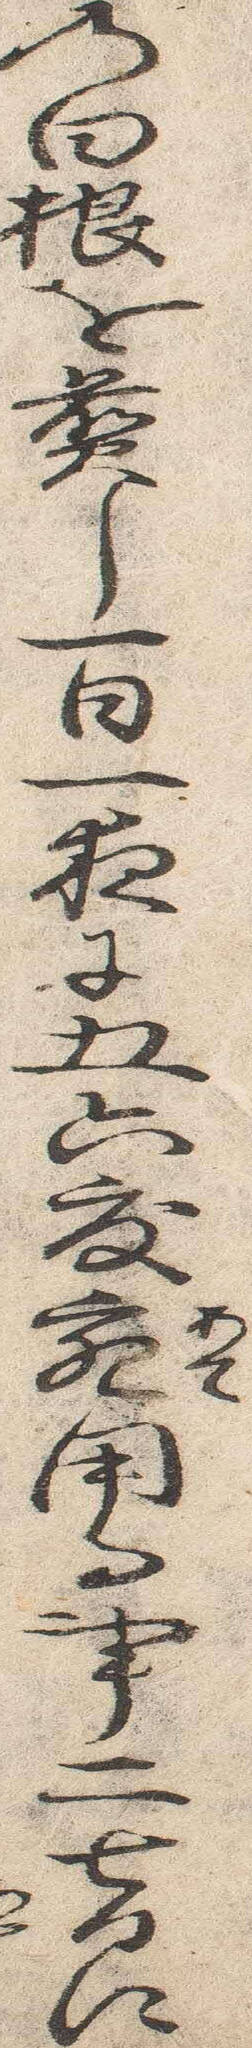の白根を煎し一日一夜に五六度宛用る事二七日に
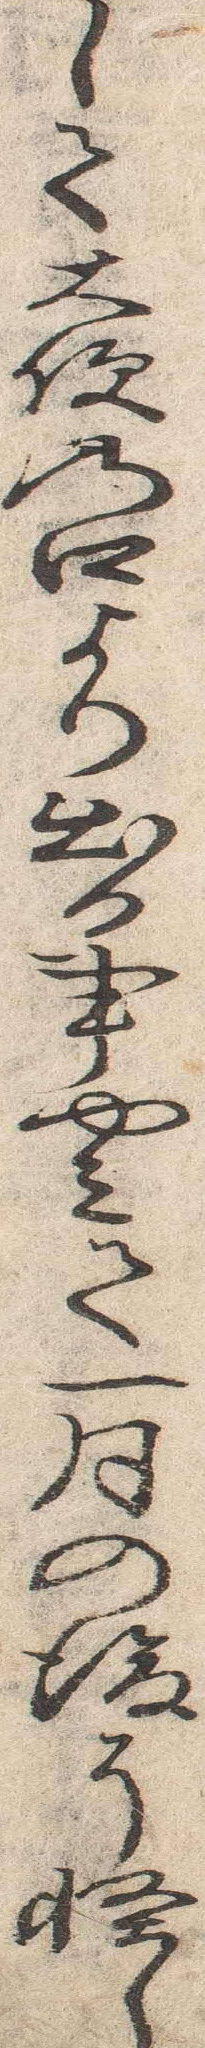して大便の口より出る事やみて一月の後に怪し
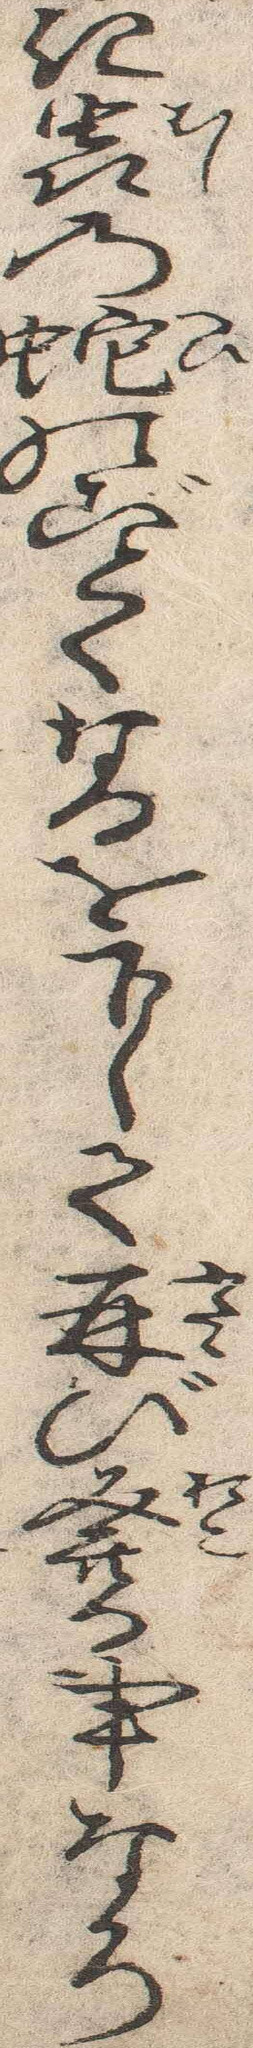き虫の蛇のごとくなるを下して再び発る事なかり
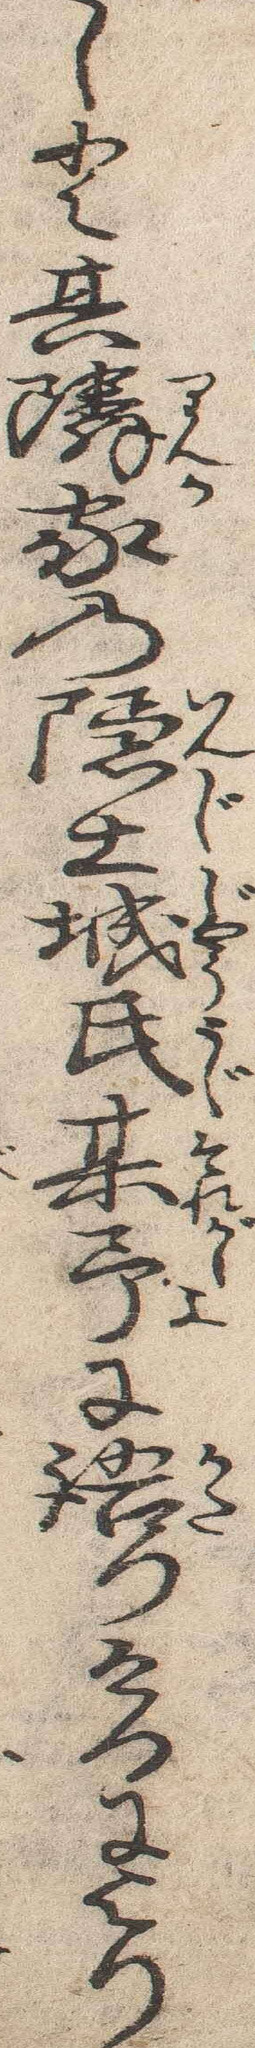しと其隣家の隠士城氏某予に語りけるにより
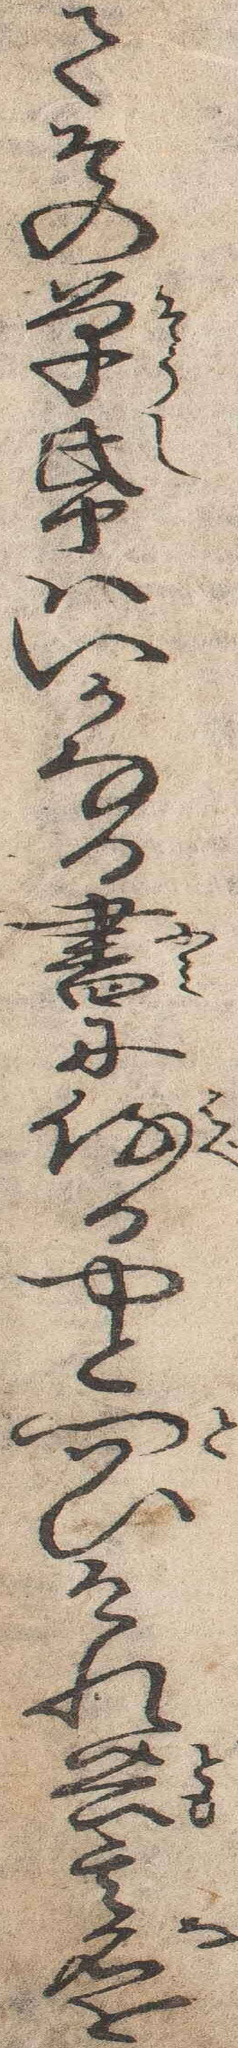てその草紙はいかなる書に侍るやと問ひけれ共其名を

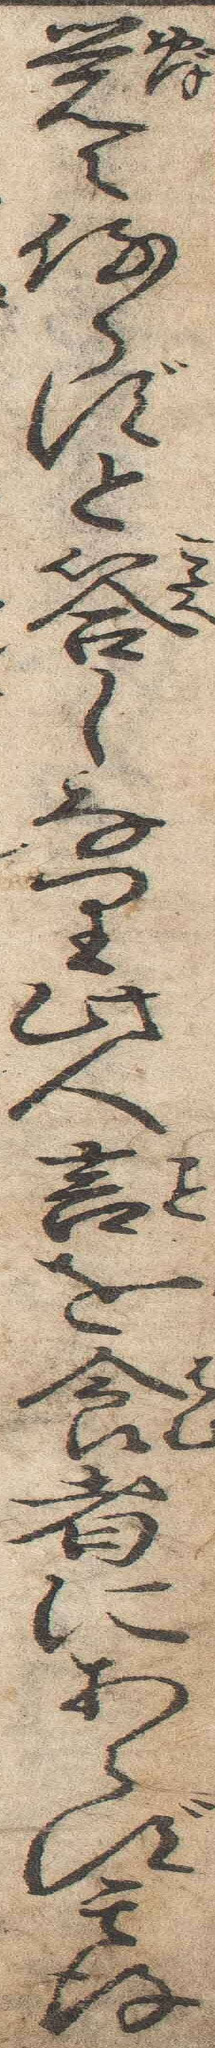覚え侍らずと答しなり此人言を食者にあらず其後
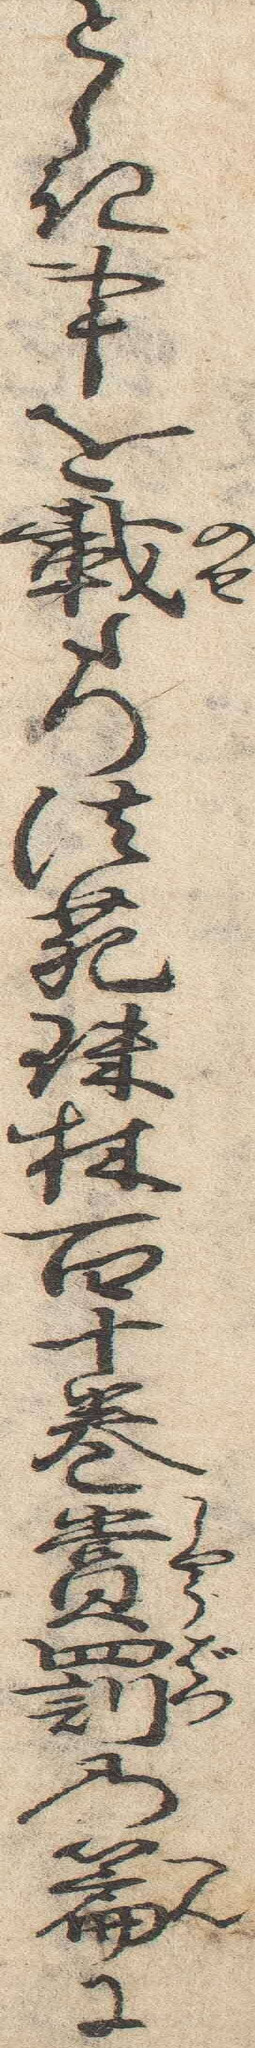としき事を載たり法苑珠林百十巻賞罰の篇に
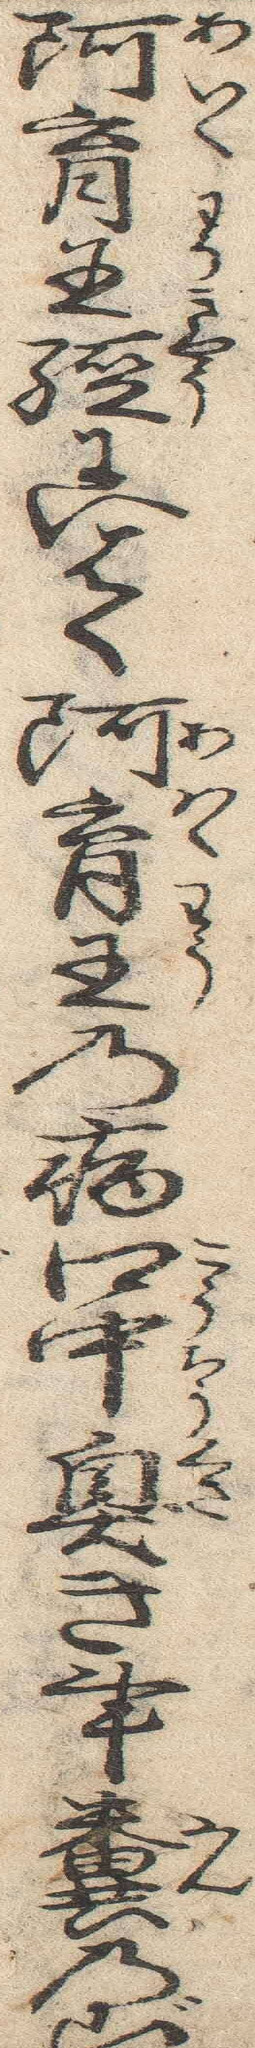阿育王経にいはく阿育王の病口中臭き事糞のご
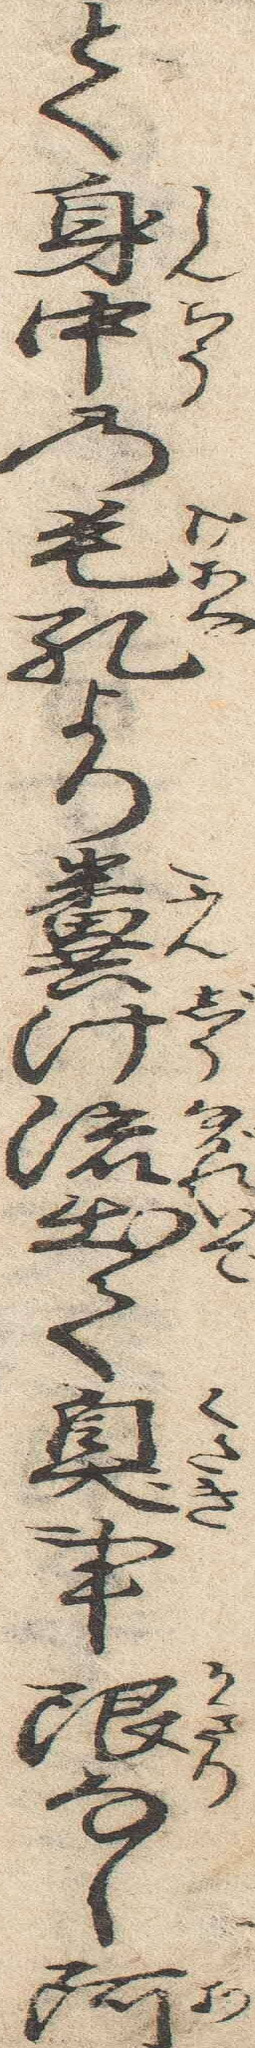とく身中の毛孔より糞汁流出て臭事限なし阿
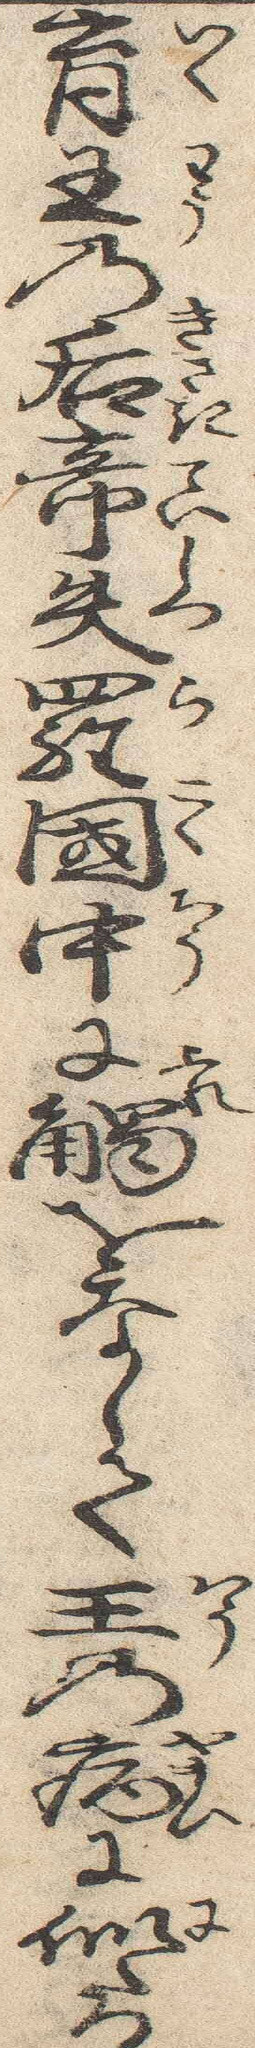育王の后帝失羅国中に触をなして王の病に似たる
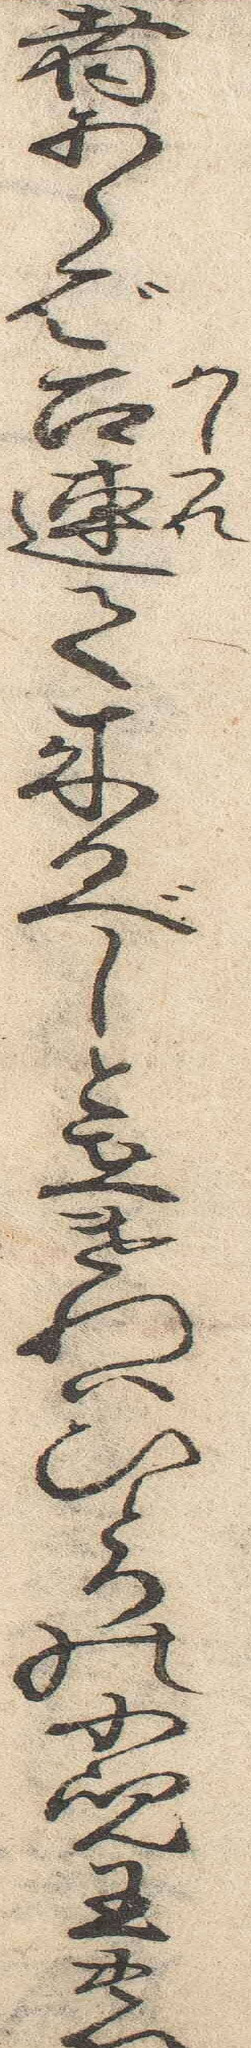者あらば召連て来るべしと在けれはひとりの小児王の
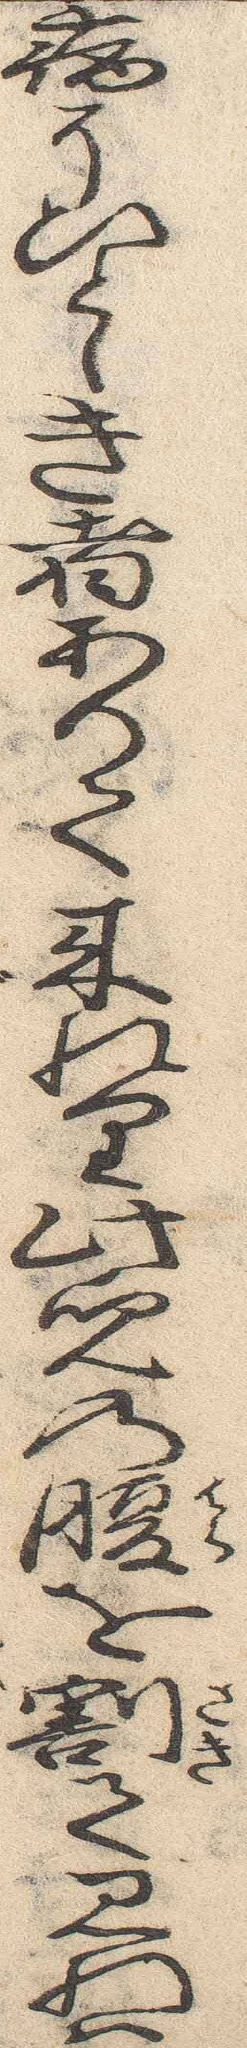病にひとしき者ありて来れり此児の腹を割てみれは
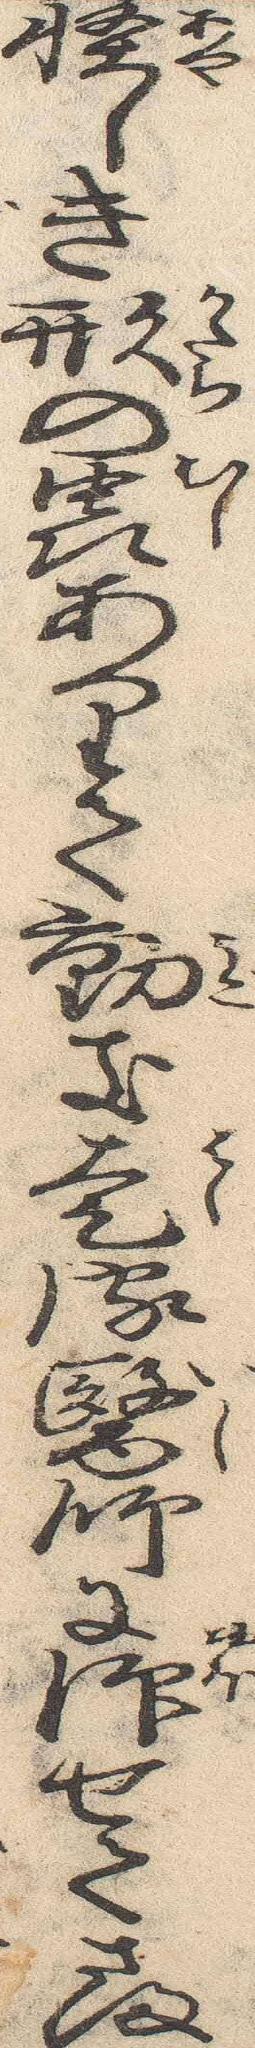怪しき形の虫ありて動き走る医師に仰せてさま
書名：小児必用養育草
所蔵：東京学芸大学附属図書館 国文学研究資料館
